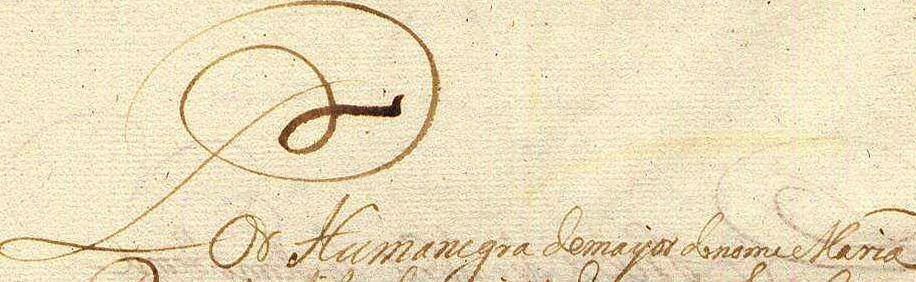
Por Huma negra de mayor do nome Maria
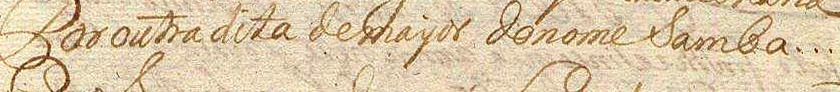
Por outra dita de mayor do nome Samba
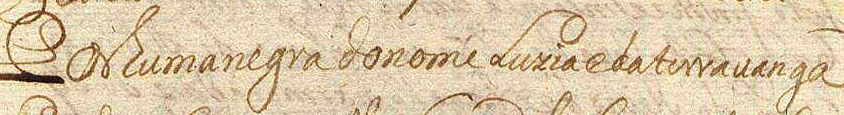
Por huma negra do nome Luzia e da terrauanga
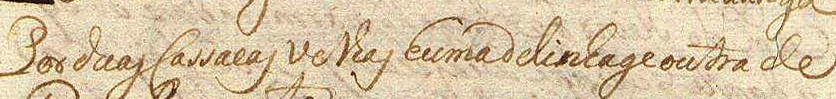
Por duas Cassacas velhas huma de linhage outra de
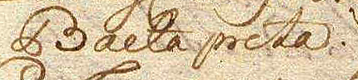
Baeta preta.
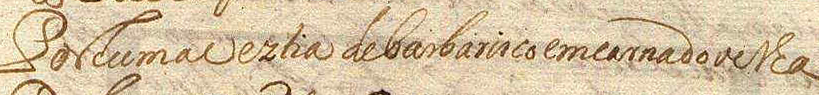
Por huma veztia de barbarisco emcarnado velha
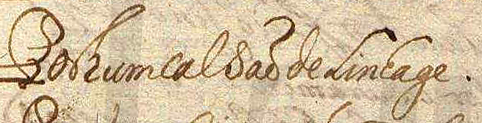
Por hum calSaõ de Linhage.
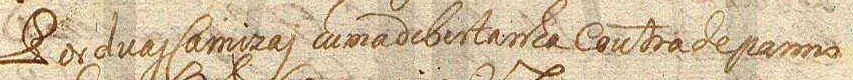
Por duas Camizas huma de bertanha e outra de panno
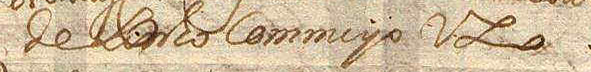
de Linho Com meyo VZo
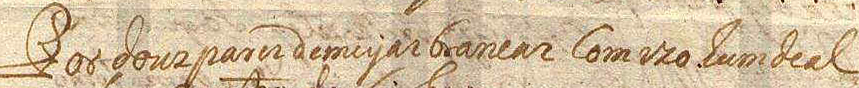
Por douz parez de meyas brancas Com vzo hum de al
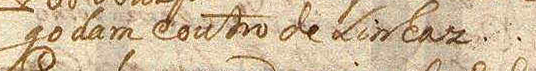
godam e outro de Linhaz.
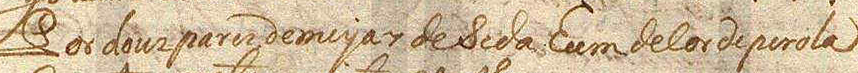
Por douz parez de meyas de Seda hum de cor de perola
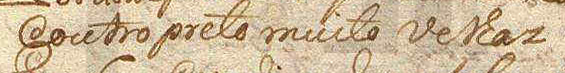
e outro preto muito velhaz
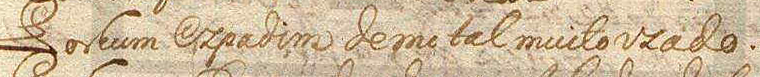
Por hum ezpadim de metal muito vzado.
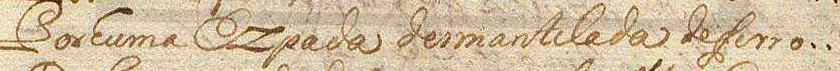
Por huma Ezpada desmantelada de ferro
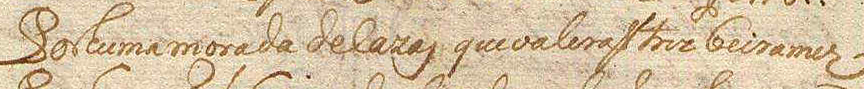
Por huma morada de Cazas que valeraõ trez beiramez
